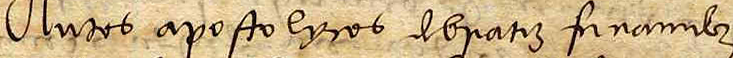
Autos apostolycos de briatiz fernamdez
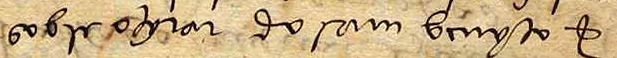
sobre o tyrar do sam benyto
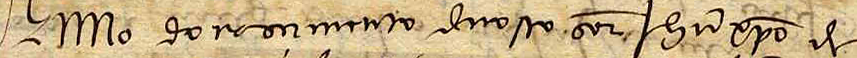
ANNo do nasçimento de nosso s̄or Jhū xp̄o de
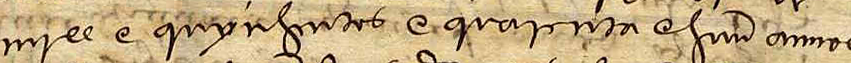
mjll e quynhentos e quarenta e huū annos
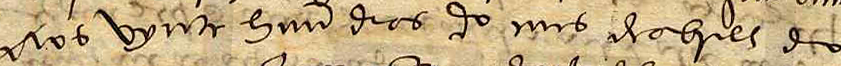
Aos vynte huū dias do mes de abrill do
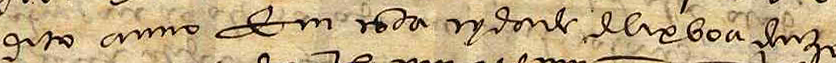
dito anno Em esta cydade de lixboa dentro
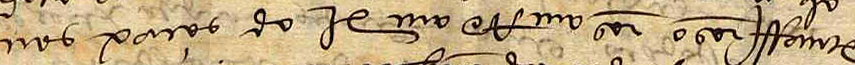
nos paços do Jlmo e Rmo s̄or o s̄or Jffante
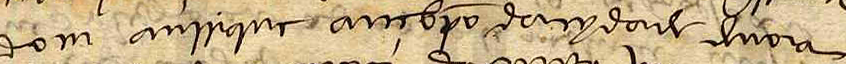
dom anrrique arçebp̄o da cydade deuora
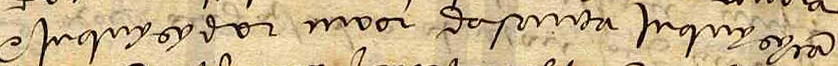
e Jnquysydor moor da santa Jnquysyçā
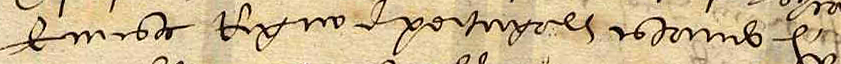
Em este Regno de portugall estamdo hy
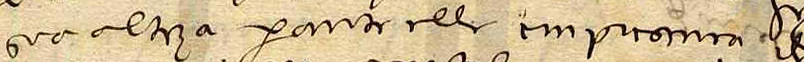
sua alteza ꝑante elle em presença de
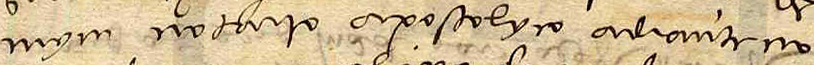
mym notarjo apostolyco adiante no
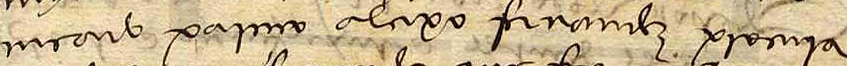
meado pareçeo aleixo fernandez procura
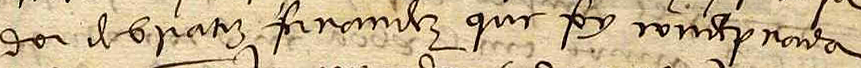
dor de briatiz fernandez que foy condepnada
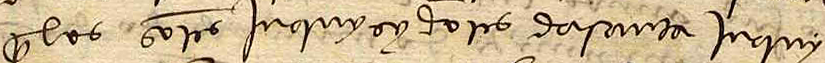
p̄los s̄ores Jnquysydores da santa Jnquy
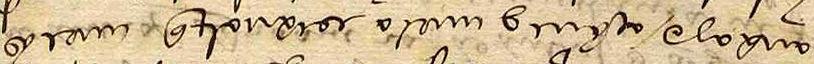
syçam q̄ trouxese o sam benyto / e loguo
